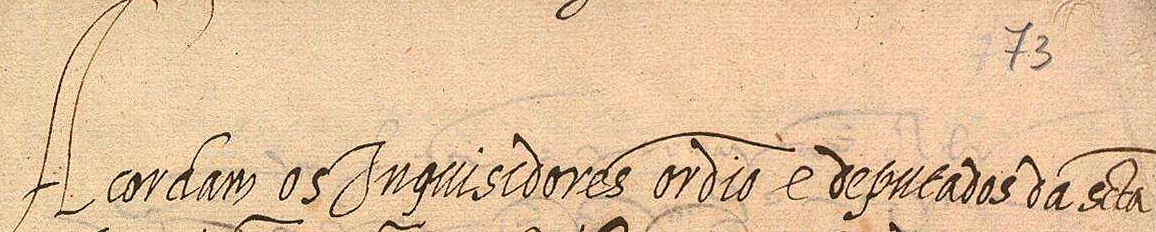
Acordam os Jnquisidores o̅rdio e deputados da s̅cta
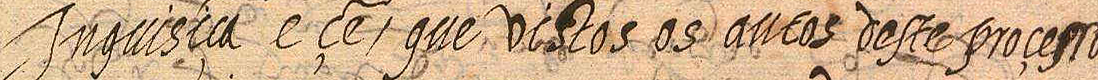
Jnquisīça e çē / que vistos os autos deste proçesso
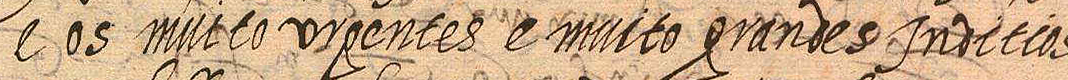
e os muito vrgentes e muito grandes Jnditios
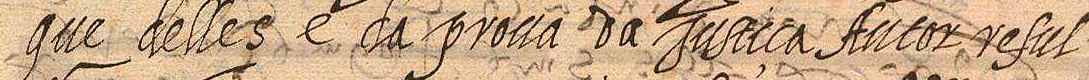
que delles e da proua da Justiça Autor resul
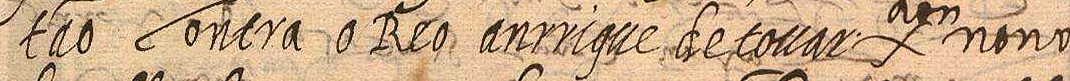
tão Contra o Reo anrrique de touar xam nouo
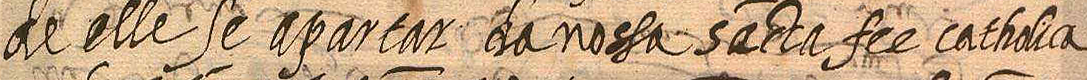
de elle se apartar da nossa sa̅cta fee catholica
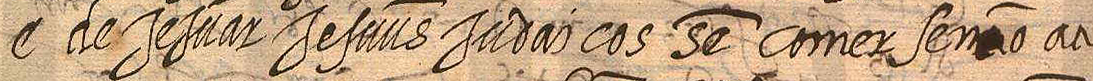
e de JeJu̅ar Jeju̅us Judaicos s̅e comer senão aa
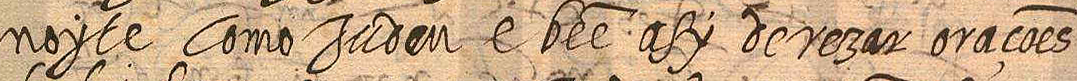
noyte Como Judeu e beē asy de rezar orações
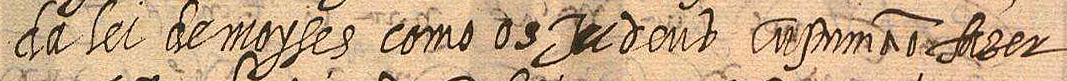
da lei de moyses como os Judeus custumão fazer
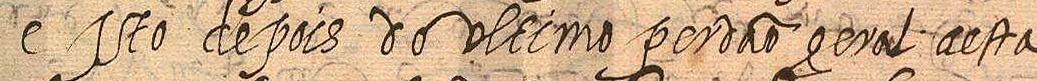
e Jsto depois do vltimo perdão geral a esta
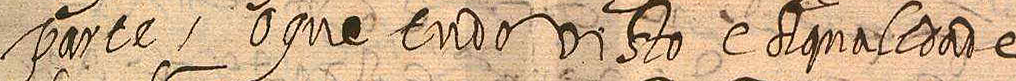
parte / o que tudo visto e A qualidade
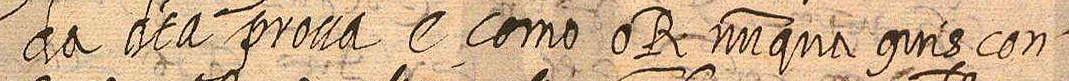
da dt̅a proua e como o R. nu̅qua quis con
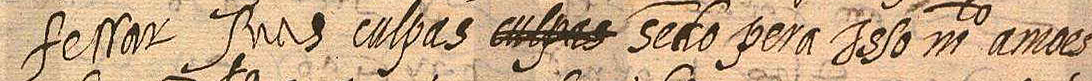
fessar suas culpas culpas s̅edo pera Jsto mto amoes
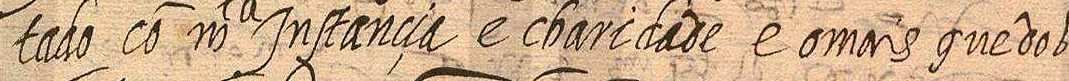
tado co̅ mta Jnstançia e charidade e o mais que dos
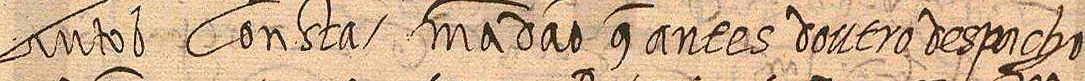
autos Consta / m̅adão q̅ antes doutro despacho
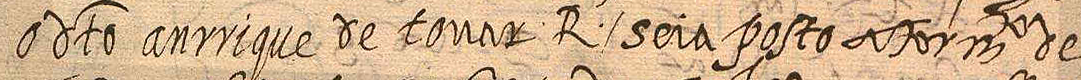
o dt̅o anrrique de touar .R. / seia posto a tormto de
